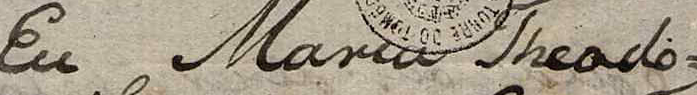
Eu Maria Theodo
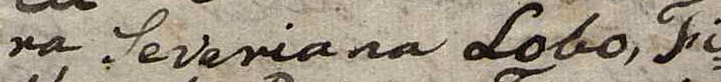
ra Severiana Lobo, fi
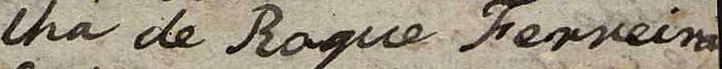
lha de Roque Ferreira
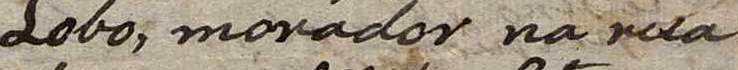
Lobo, moradora na rua
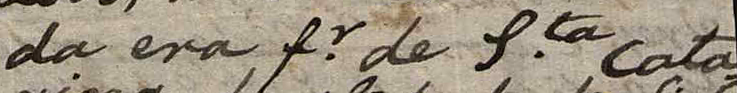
da era, fr. de S.ta Catha
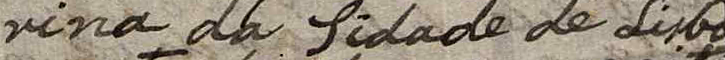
rina, da sidade de Lisbo
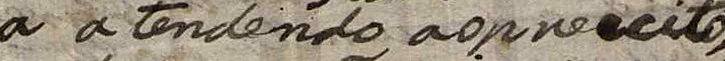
a, atendendo ao preceito,
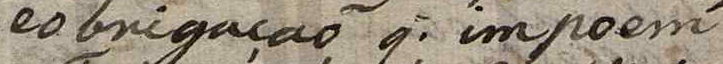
e obrigaçaõ q̄ impoem
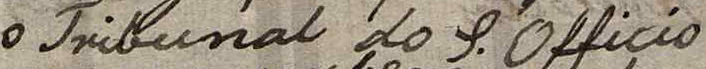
o Tribunal do S. Officio
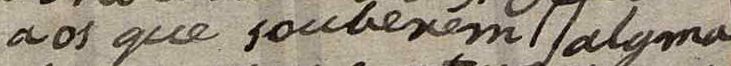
aos que souberem alguma
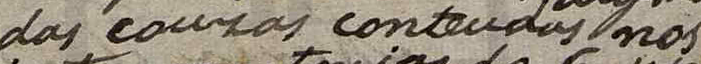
das couzas conteudas nos
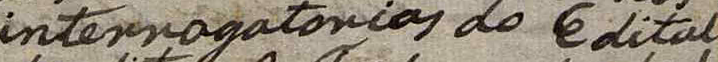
interrogatorios do Edital
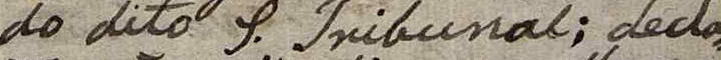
do dito S. Tribunal; decla
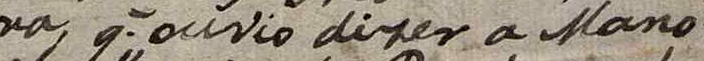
ra q̄ ouvio dizer a Mano
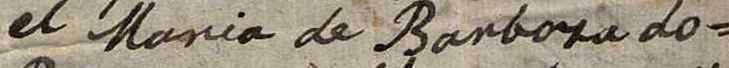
el Maria de Barboza do
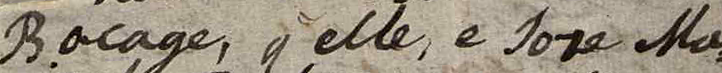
Bocage, q̄ elle, e Joze Ma
